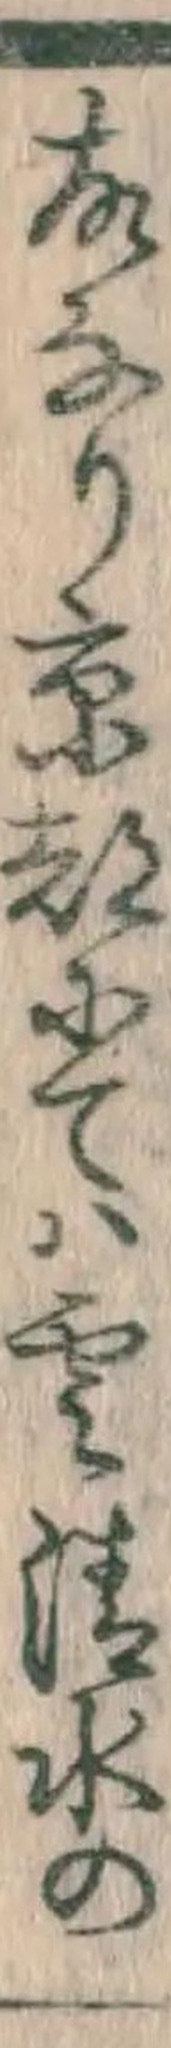故なり京都にては雲清水の
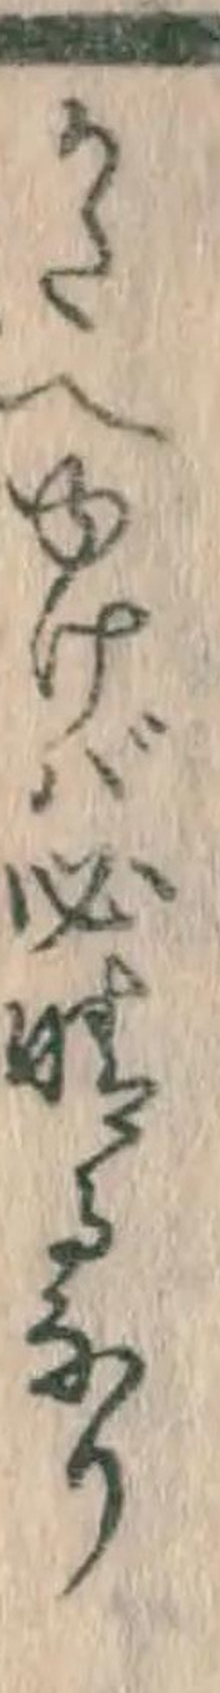かたへゆけば必晴るなり
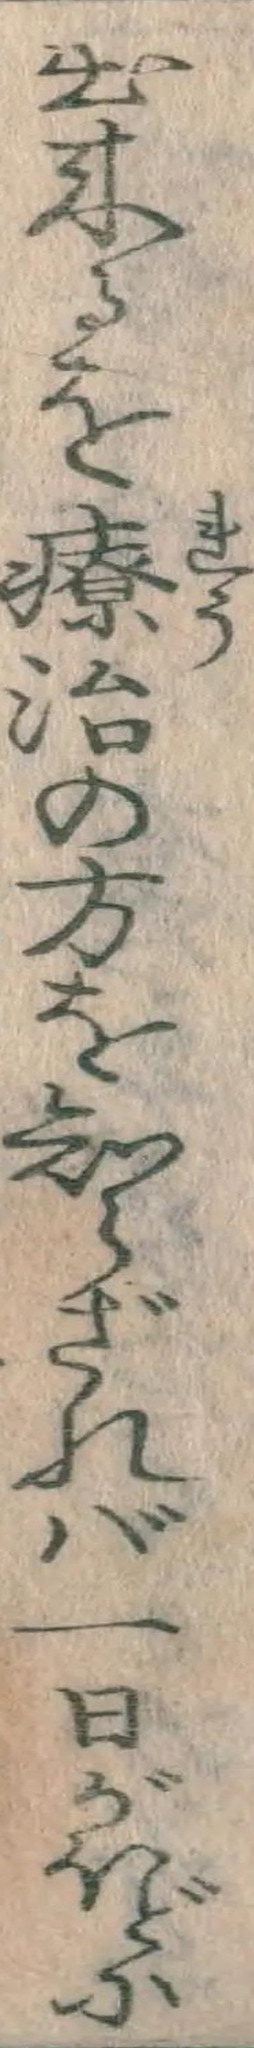出来るを療治の方を知らざれば一日がほどに
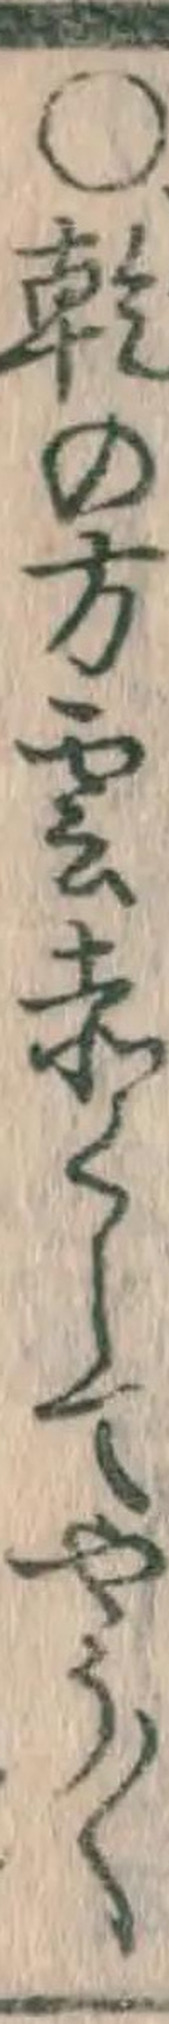○乾の方雲赤くしてやう〳〵
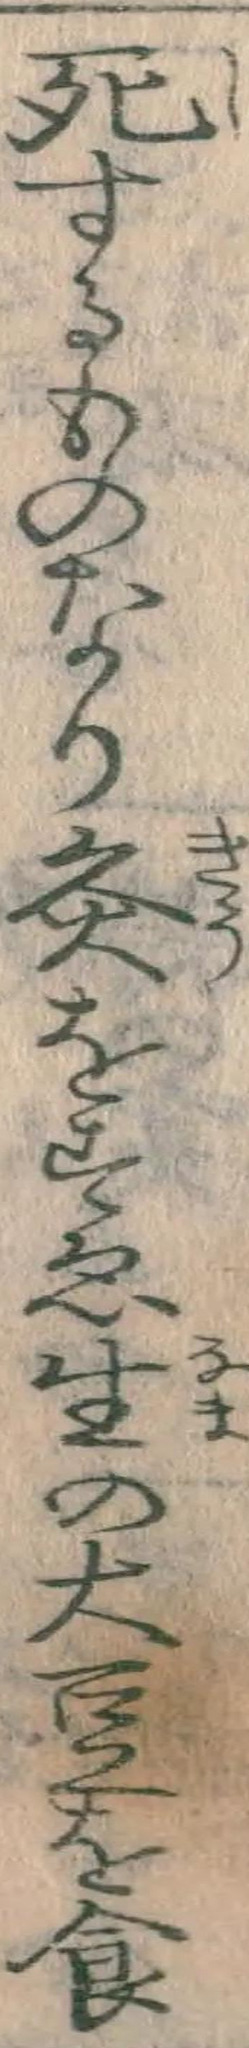死するものなり灸をすゑ生の大豆を食
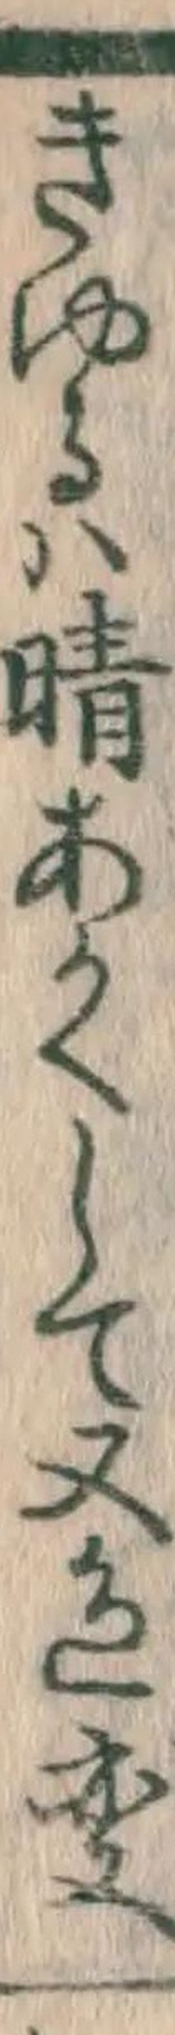きゆるは晴あかくして又色変
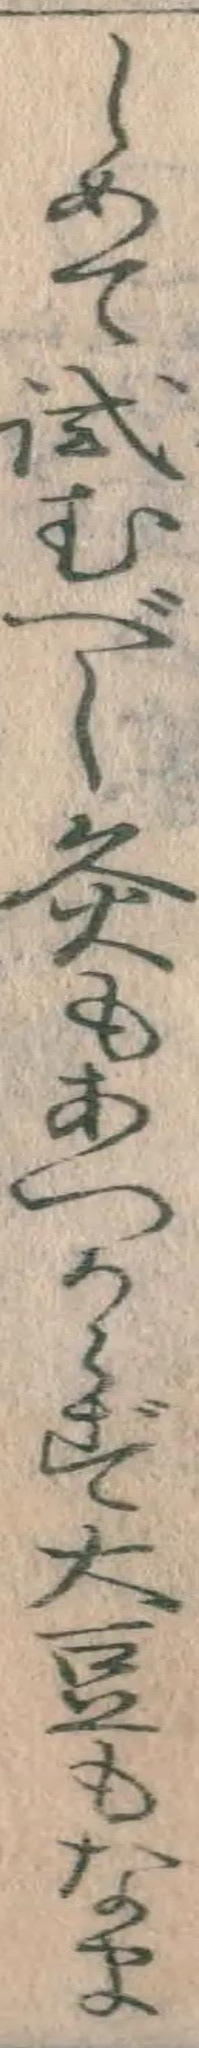しめて試むべし灸もあつからず大豆もなま
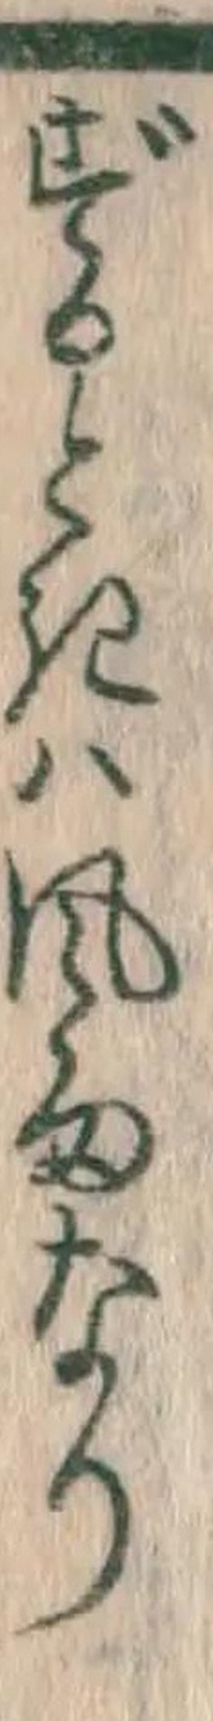ずるときは風雨なり
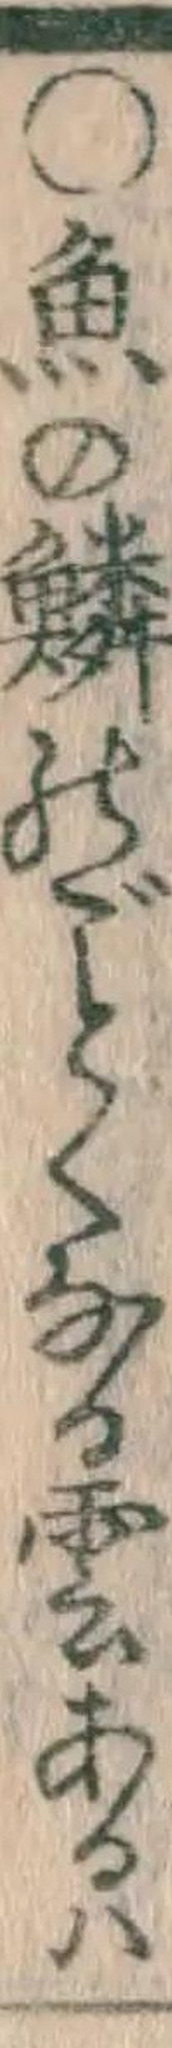○魚の鱗のごとくなる雲あるは
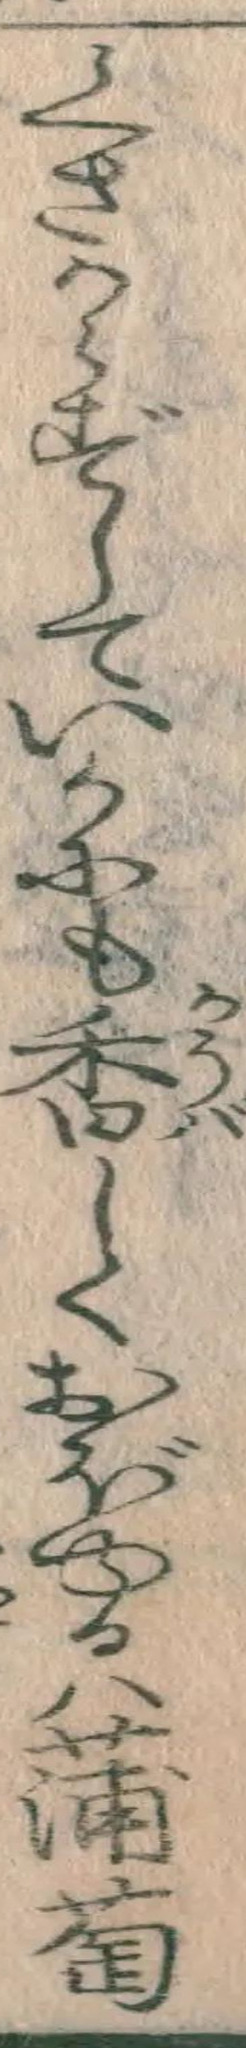くさからずしていかにも香しくおぼゆるは蒲萄
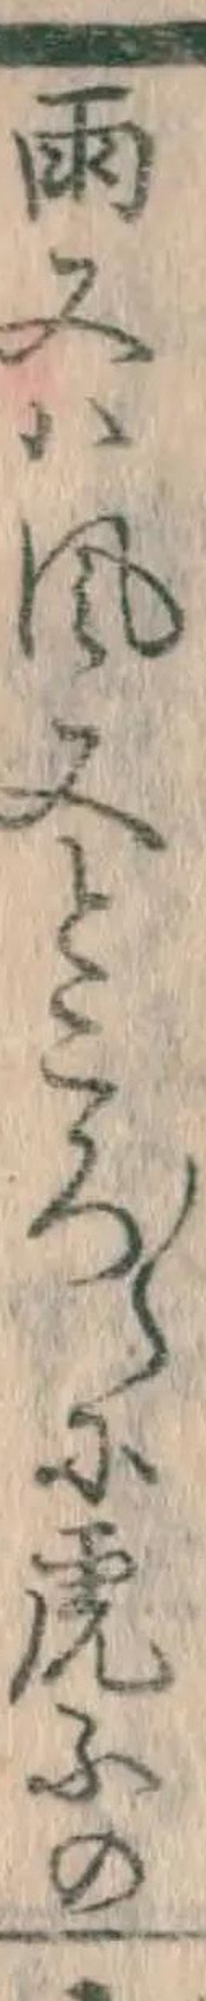雨又は風又ところ〳〵に虎ふの
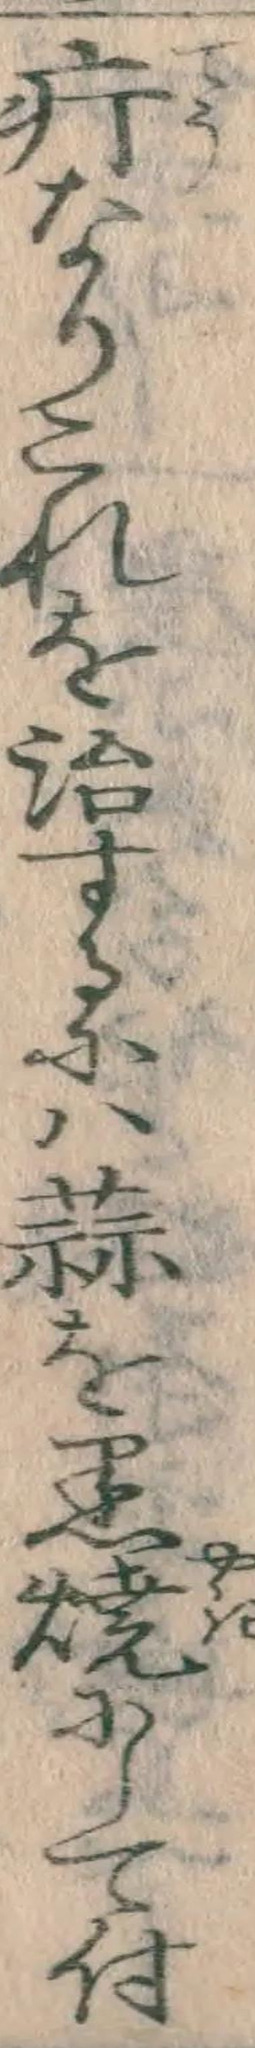疔なりこれを治するには蒜を黒焼にして付
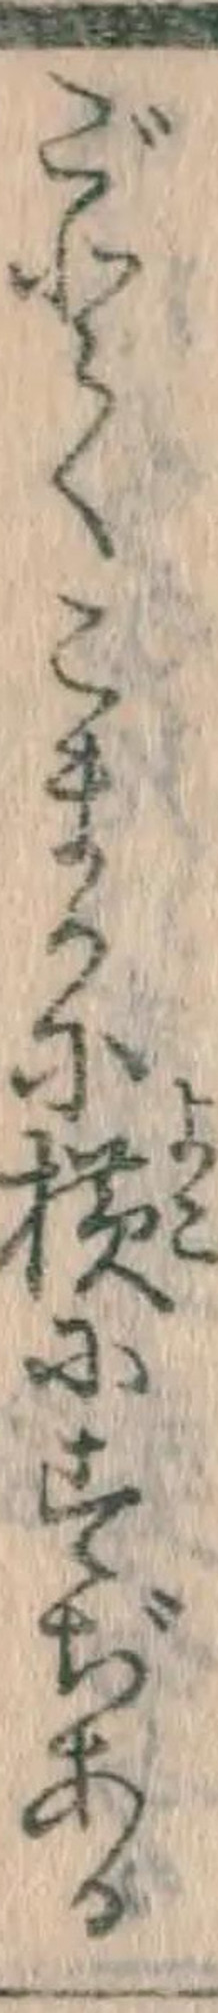ごとくこまかに横にすぢある
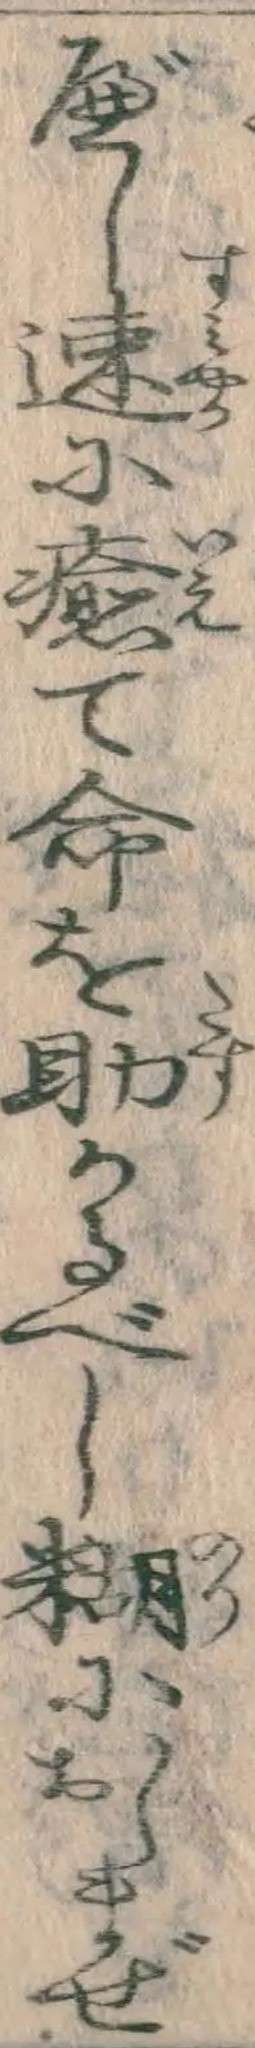べし速に癒て命を助かるべし糊におしまぜ
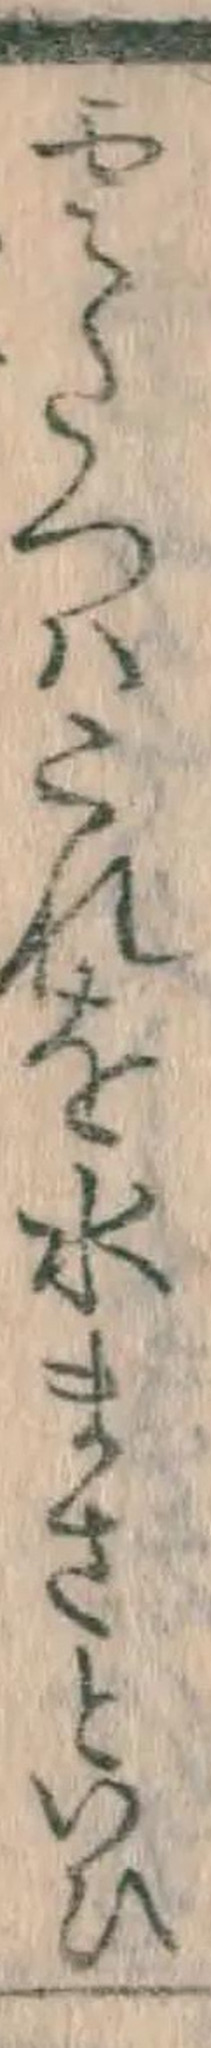雲たつはこれを水まさといひ
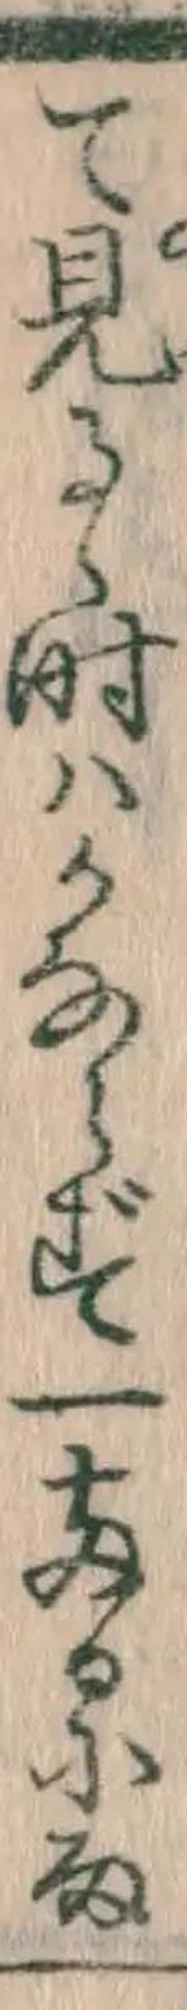て見るゝ時はかならず一両日に雨
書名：広益秘事大全 3巻. [4]
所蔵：国立国会図書館 National Diet Library, JAPAN
